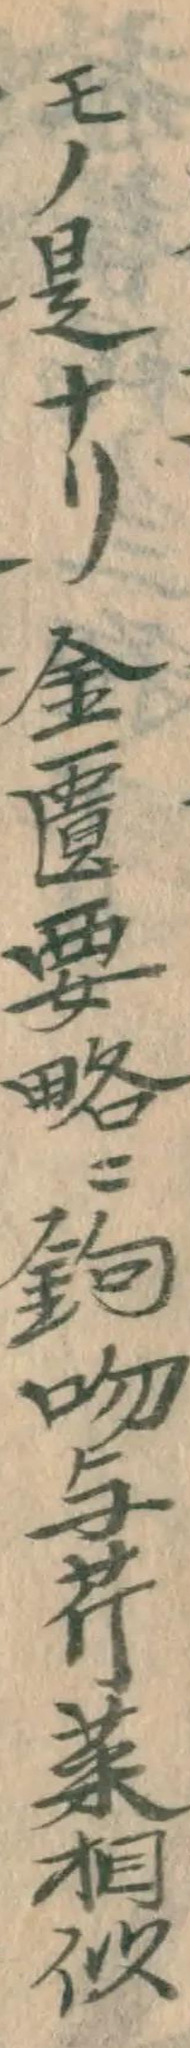モノ是ナリ金匱要略ニ鉤吻与芹葉相似
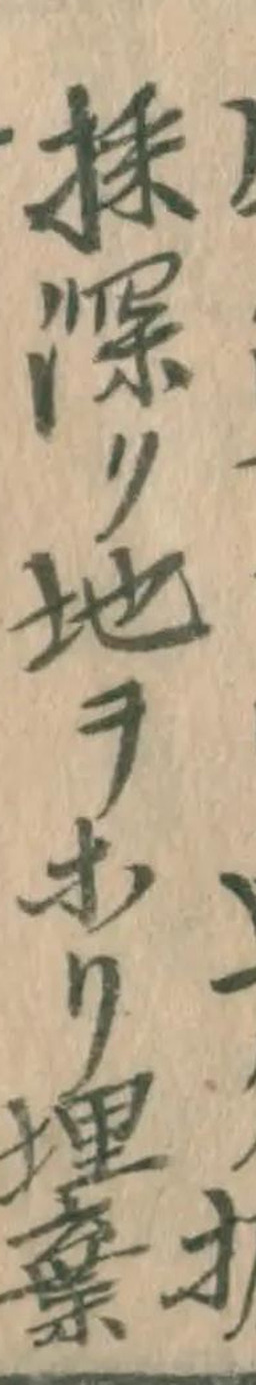採深ク地ヲホリ埋棄
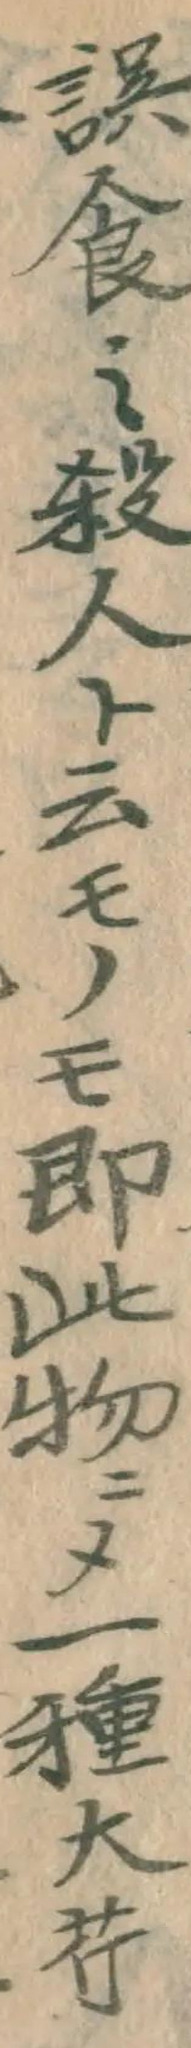誤食之殺人ト云モノモ即此物ニシテ一種大芹
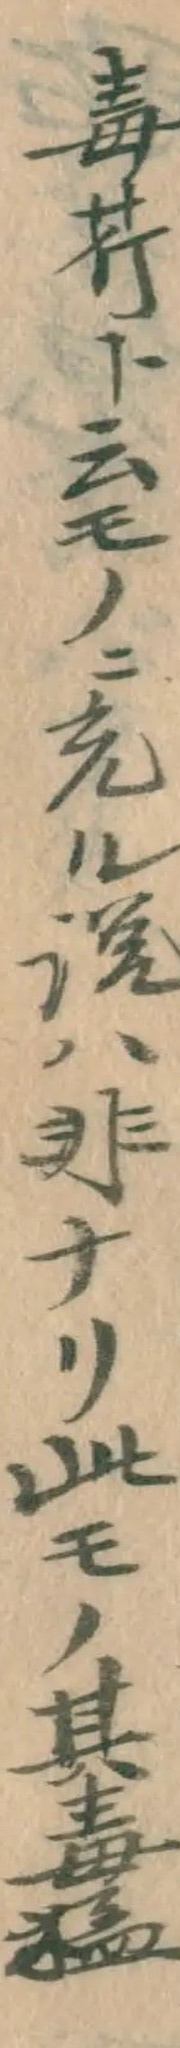毒芹ト云モノニ充ル説ハ非ナリ此モノ其毒猛

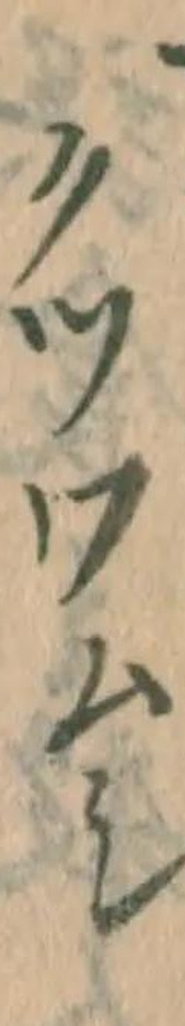クツワムシ
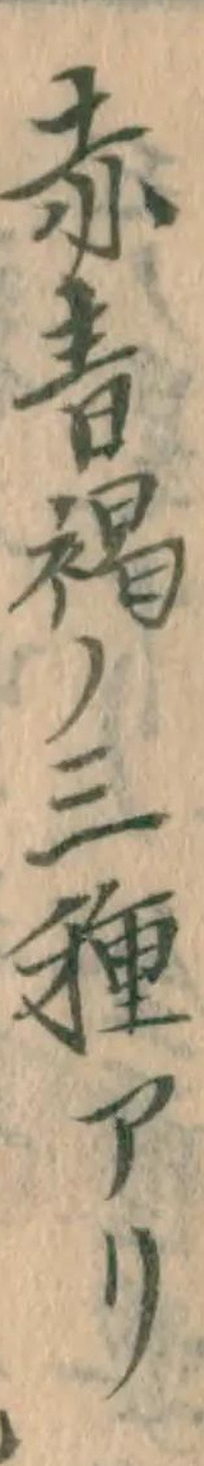赤青褐ノ三種アリ
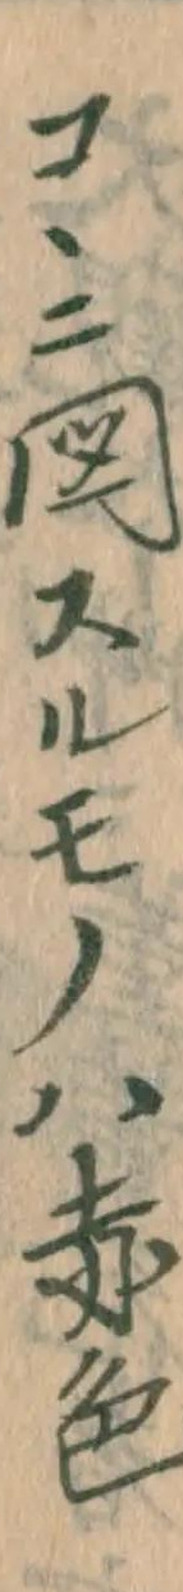コヽニ図スルモノハ赤色
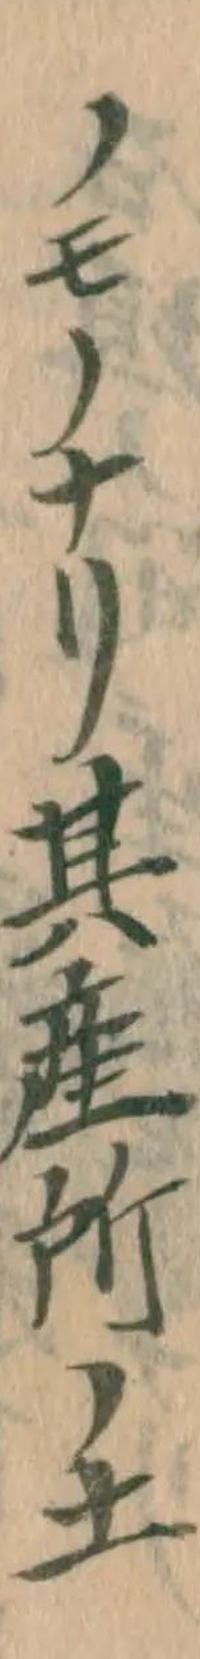ノモノナリ其産所ノ土
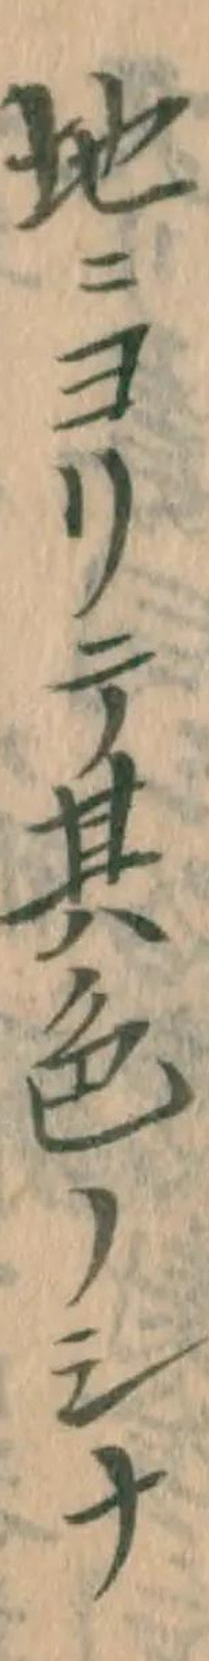地ニヨリテ其色ノシナ
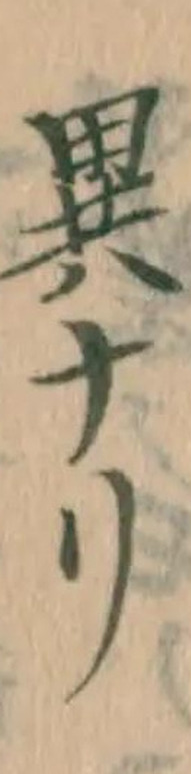異ナリ
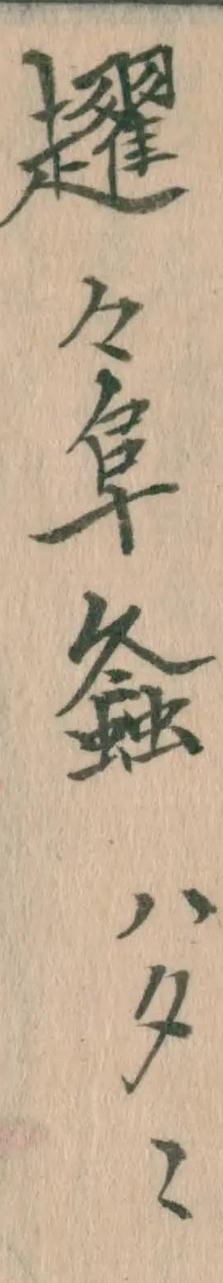趯々阜螽ハタ〳〵
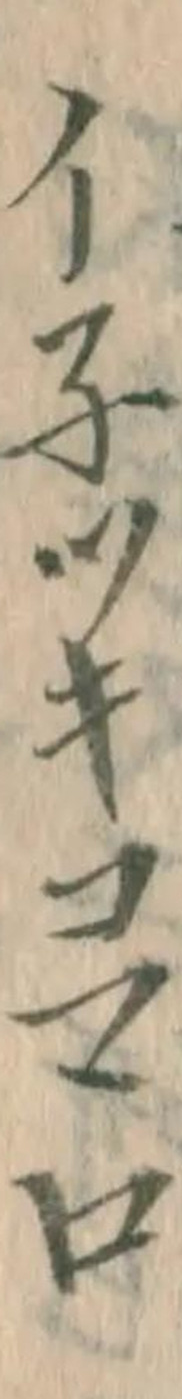イネツキコマロ
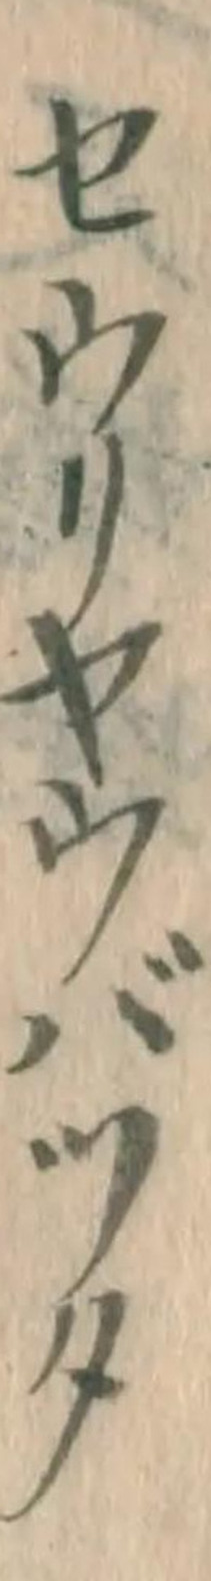セウリヤウバツタ

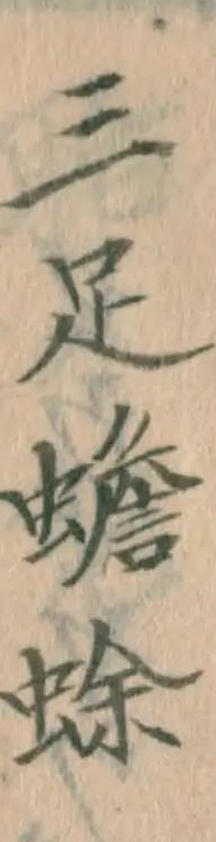三足蟾蜍
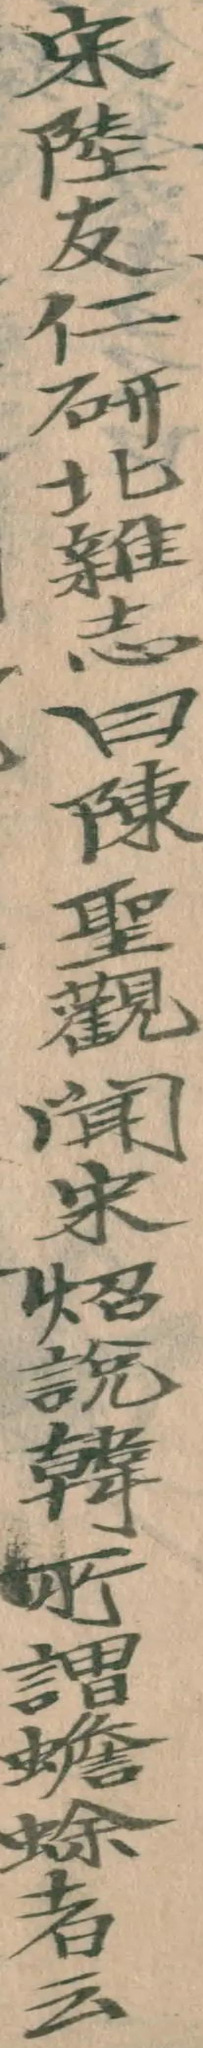宋陸友仁研北雑志曰陳聖觀聞宋炤説韓所謂蟾蜍者云
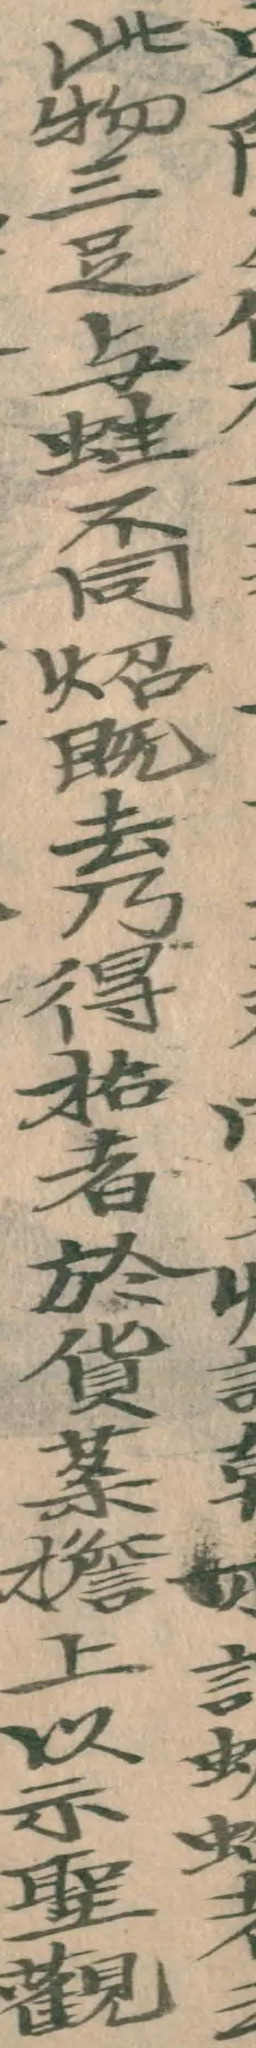此物三足与蛙不同炤既去乃得枯者於貨薬檐上以示聖觀
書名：千蟲譜 3巻. [1]
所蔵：国立国会図書館 National Diet Library, JAPAN
